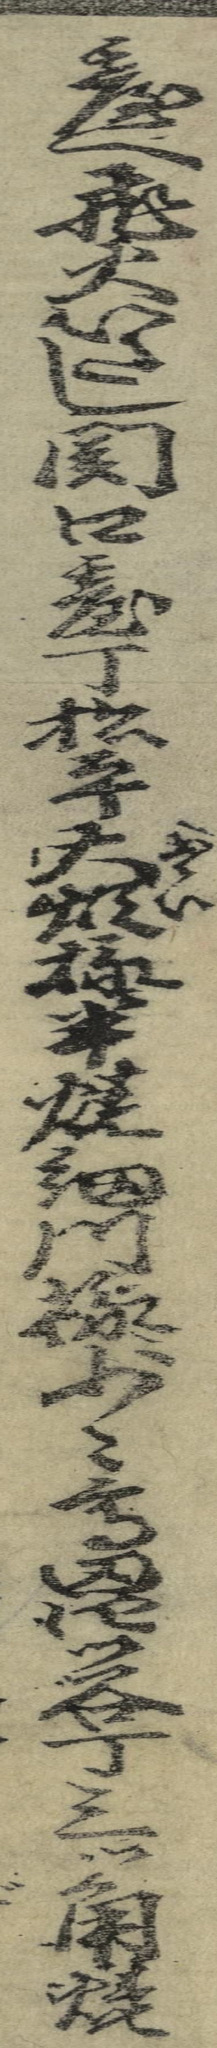台へ飛火いたし関口台丁松平大炊様半焼細川様少々高田四ッ谷丁三ッ角焼
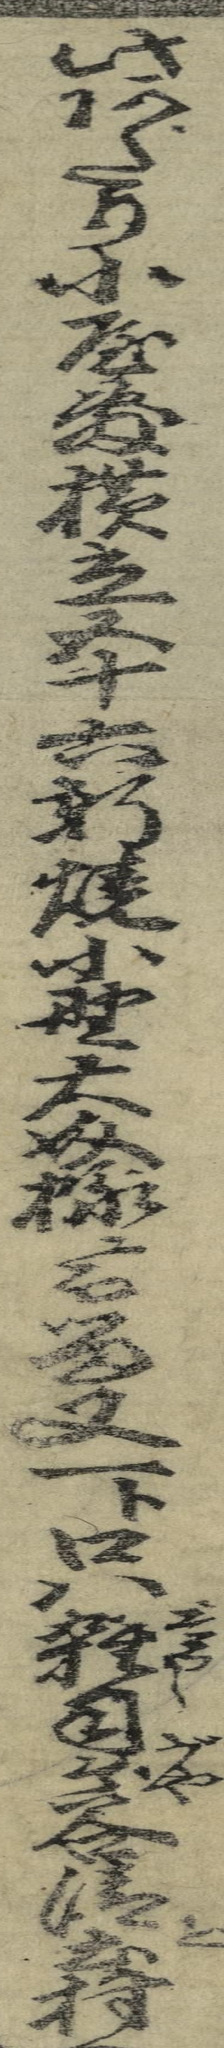此あたり小屋敷横立五十六軒焼小野大介様二而留又一ㇳ口ハ雑司ヶ谷清土村へ
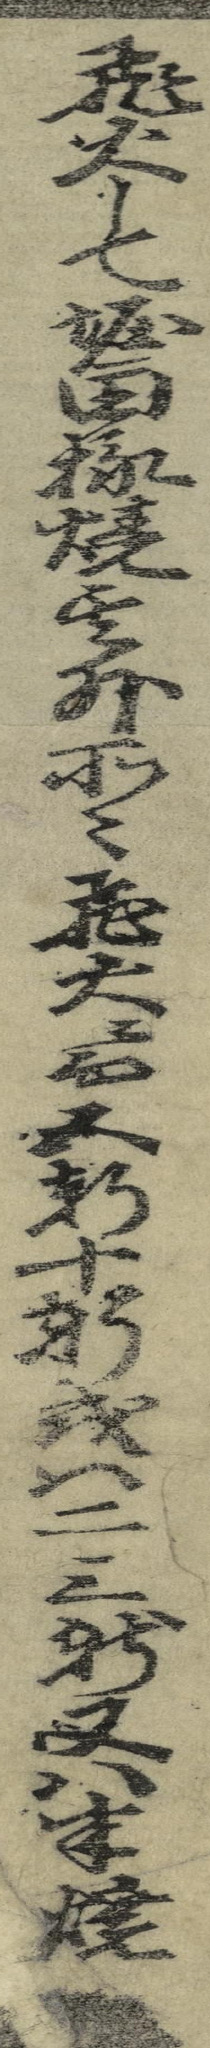飛火して堀田様焼其外所々飛火二而五軒十軒或ハ二三軒又ハ半焼
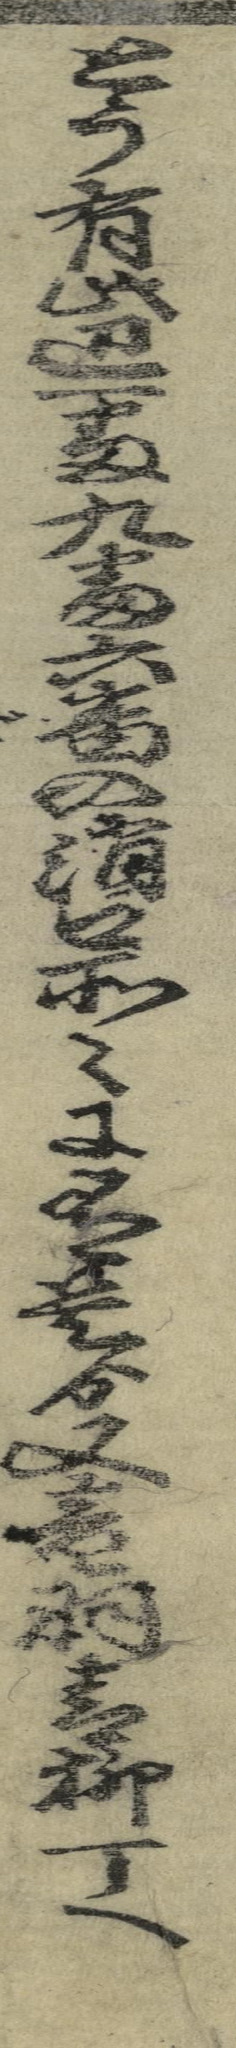とう有此辺一番九番六番の消口所々に有是ゟ又音羽青柳丁へ
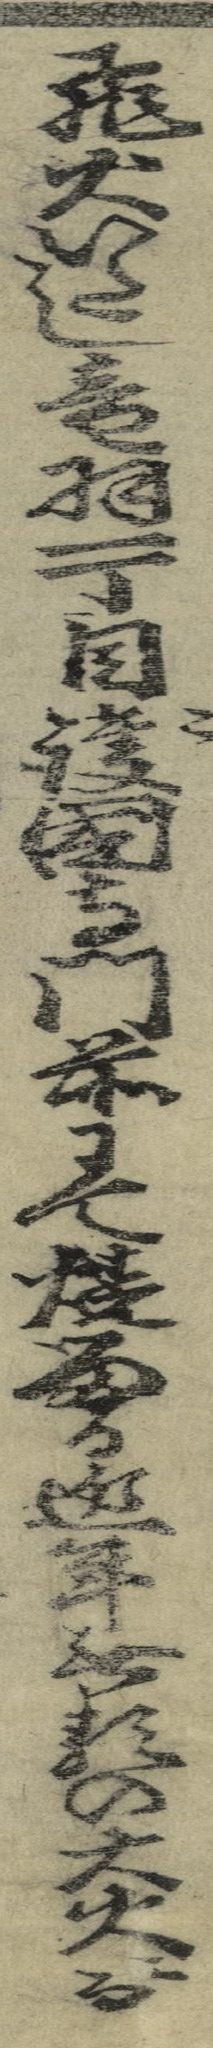飛火いたし音羽一丁目護国寺門前にて焼留る近年無類の大火二而
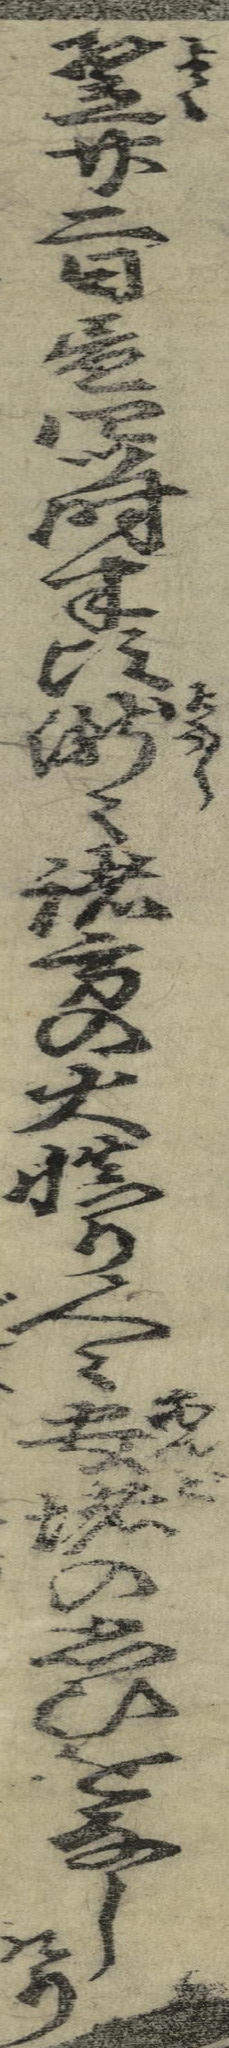翌廿二日昼四ッ時半頃漸々諸方の火鎮り人々安堵の思ひをなしけり
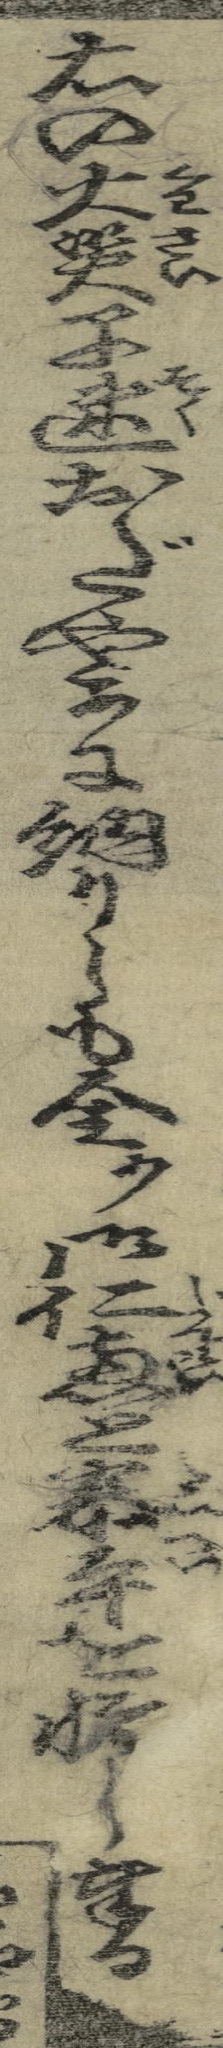右の火災早速おだやかに納りしも全ク御仁恵と泰平を祝し奉る
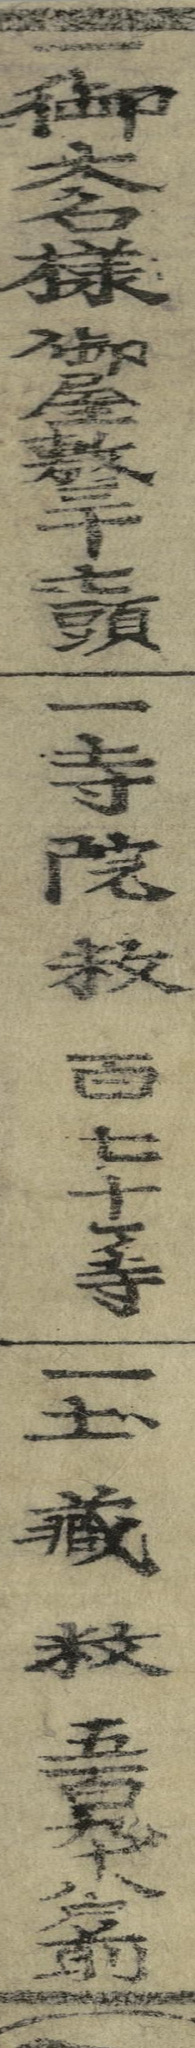一御大名様御屋敷三十七頭一寺院数百七十ヶ寺一土蔵数五百九十八戸前
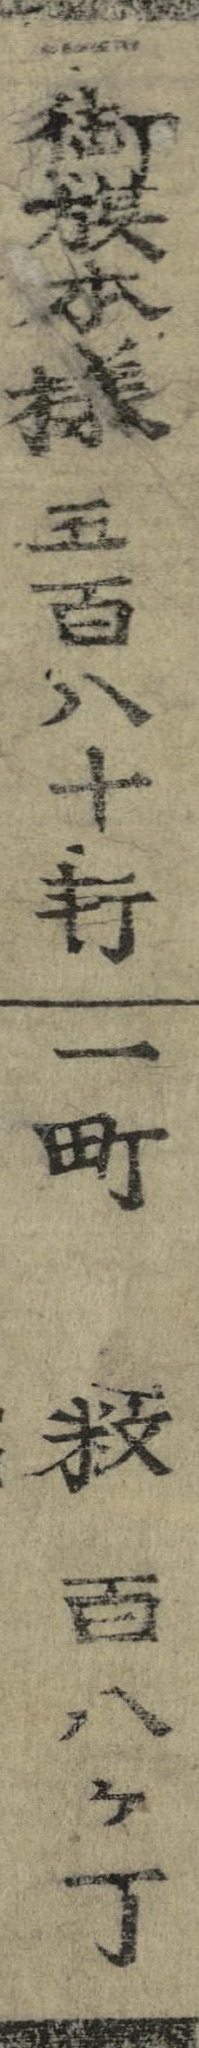一御旗本様五百八十軒一町数百八ヶ丁
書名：安政六未歳二月廿一日青山大火場所附
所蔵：東京大学地震研究所図書室 Earthquake Research Institute Library, The University of Tokyo, JAPAN
